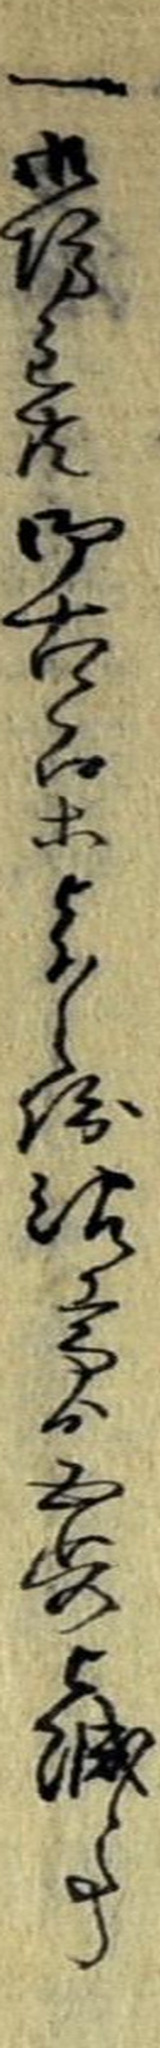一御坊主共御古召等被下候儀銀高ゟ五歩被減候事
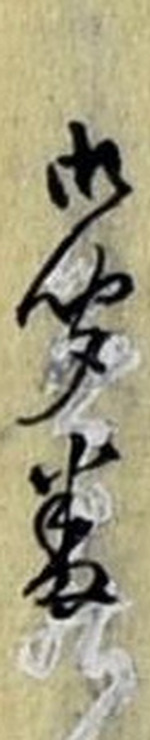御聞番

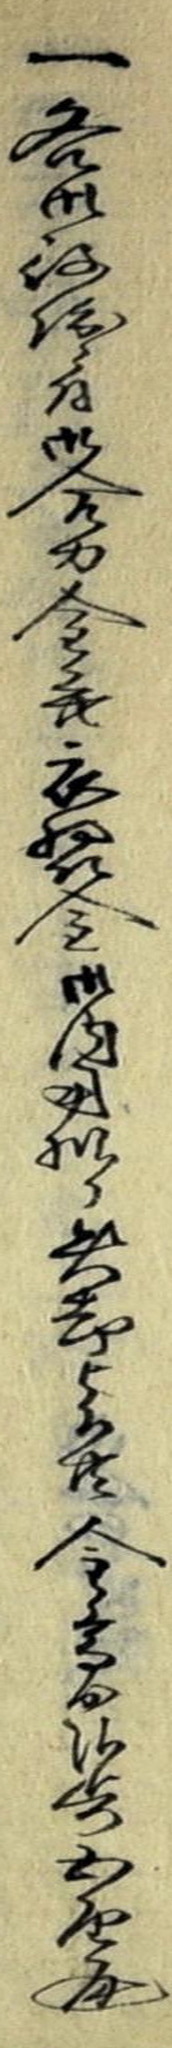一各御役儀に付御合力金并衣装金御内用掛り失却被下共金高ゟ銀歩五厘通
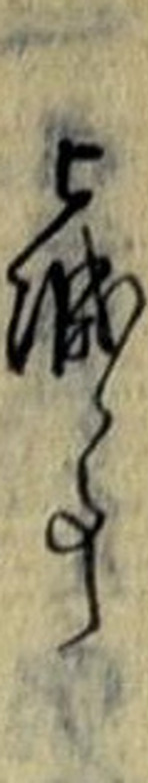被減候事
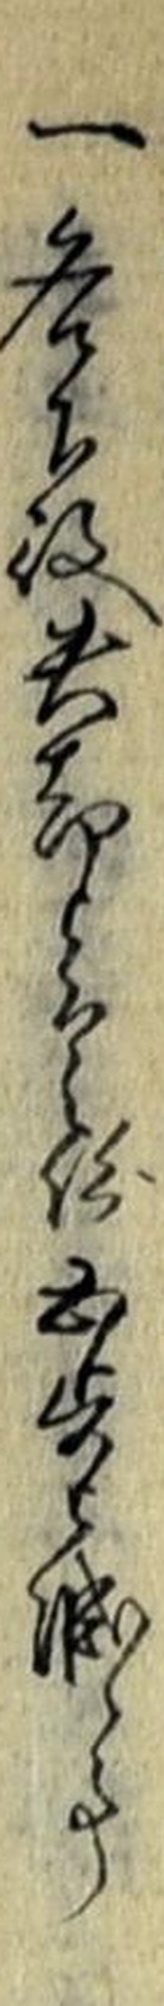一各下役失却被下候儀五歩被減候事
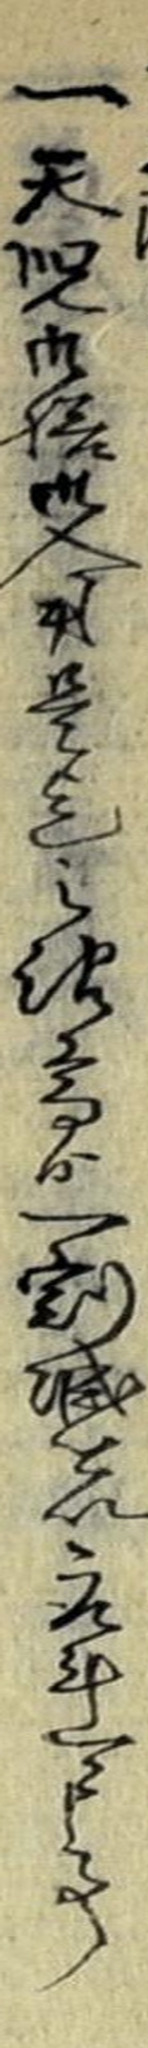一天児御膳御入用是迄之銀高ゟ一割減を以取斗可申事
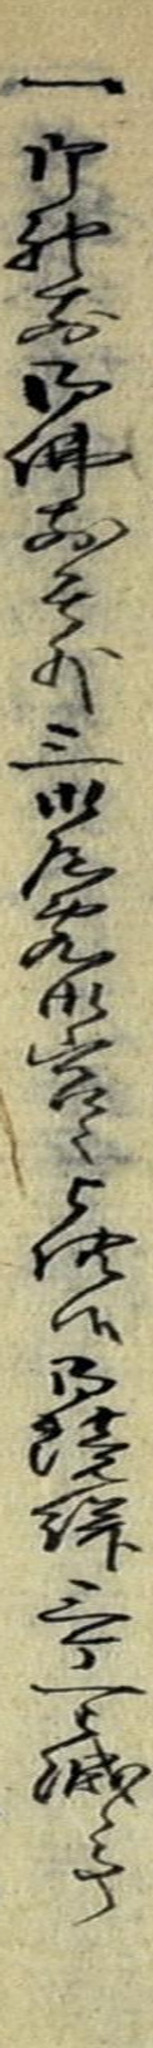一御神前御仏前其外三御屋敷御宮々被供候御鏡餅三ヶ一減候事
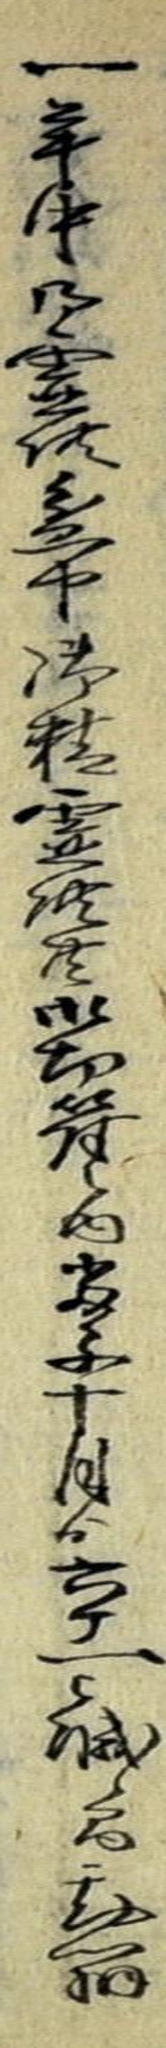一年中御霊供盆中御精霊供共御切符之内当子十月ゟ六ヶ一被減候間勘弁
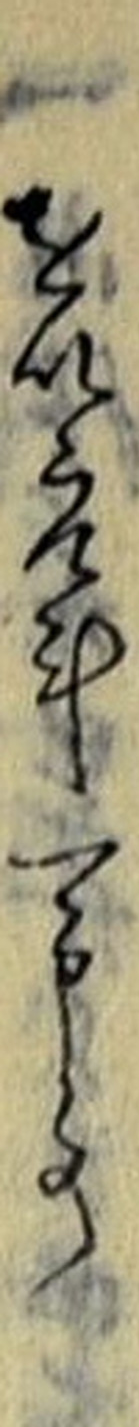を以取斗可申事
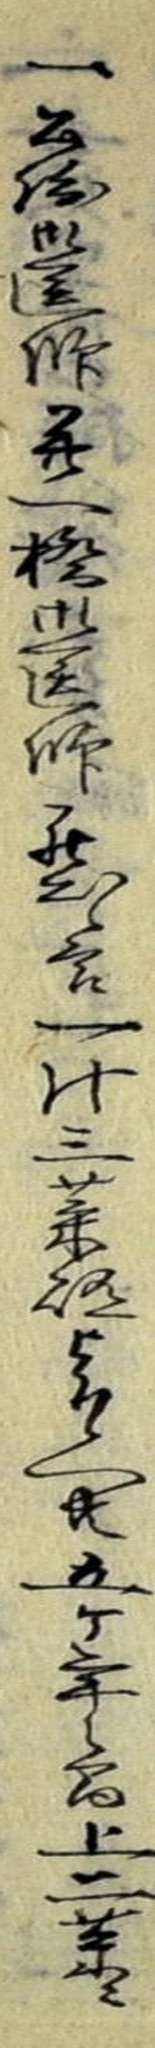一公儀御医師并一橋御医師罷出候節一汁三菜賄被下候へ共五ヶ年之間上二菜に
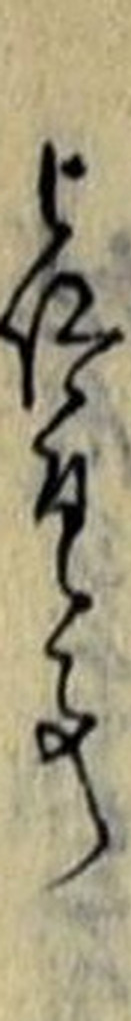被仰付候事
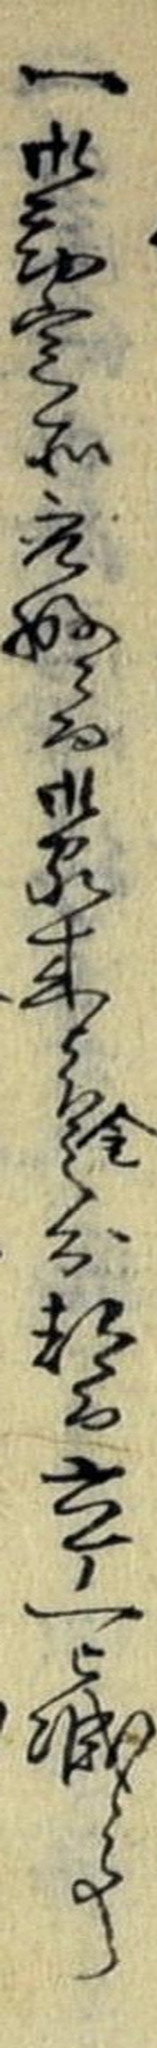一御勘定所取扱に而御家来被下金之分都而六ヶ一被減候事
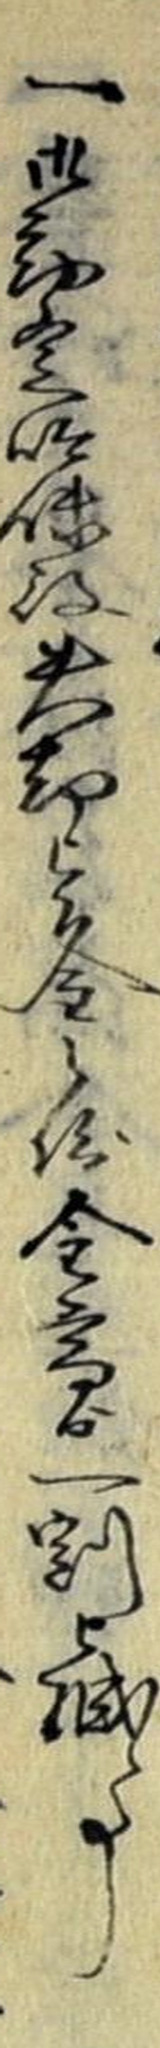一御勘定所吟味役失却被下金之儀金高ゟ一割被減候事
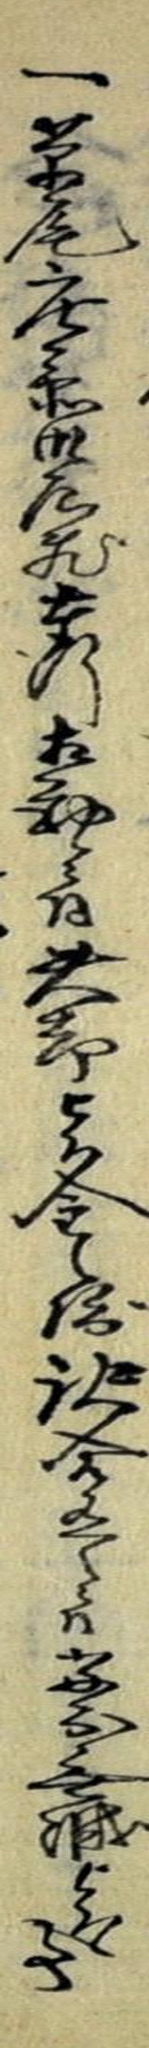一草尾庄兵衛御屋敷奉行相勤候に付失却被下金之儀訳合有之候に付当分無減被下候事
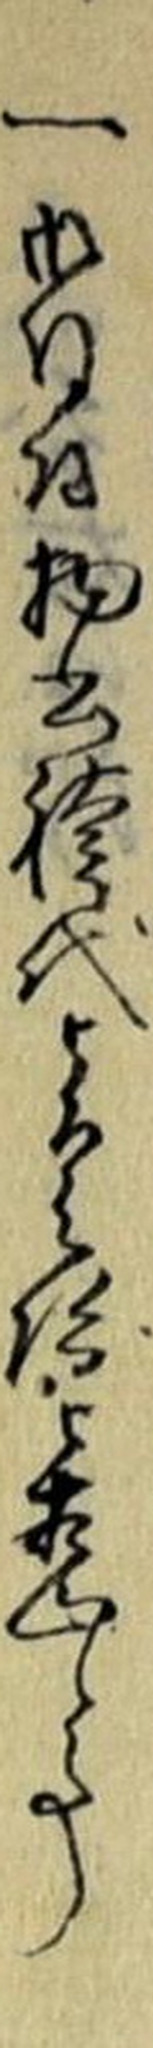一御目付物書袴代被下之儀被相止候事
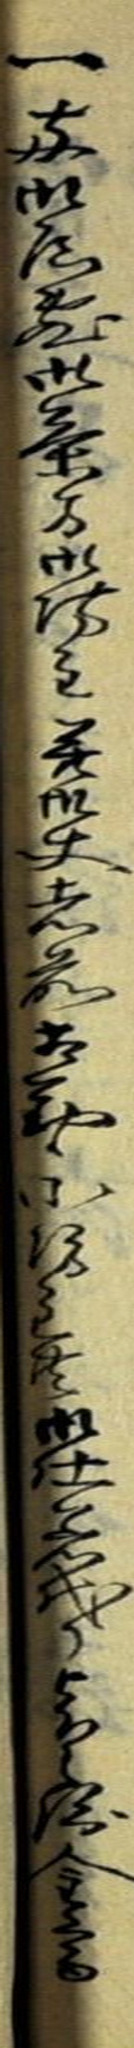一両御屋敷御茶方御坊主并御使者相勤候小坊主共御仕着代り被下候儀金高
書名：命令之部 四
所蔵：福井県文書館 Fukui Prefectural Archives
